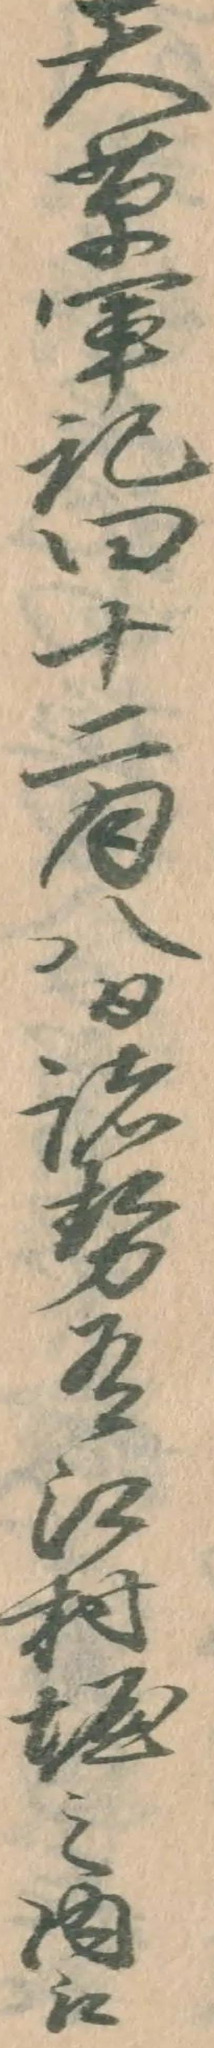天草軍記曰十二月八日諸勢有江村堀之内江
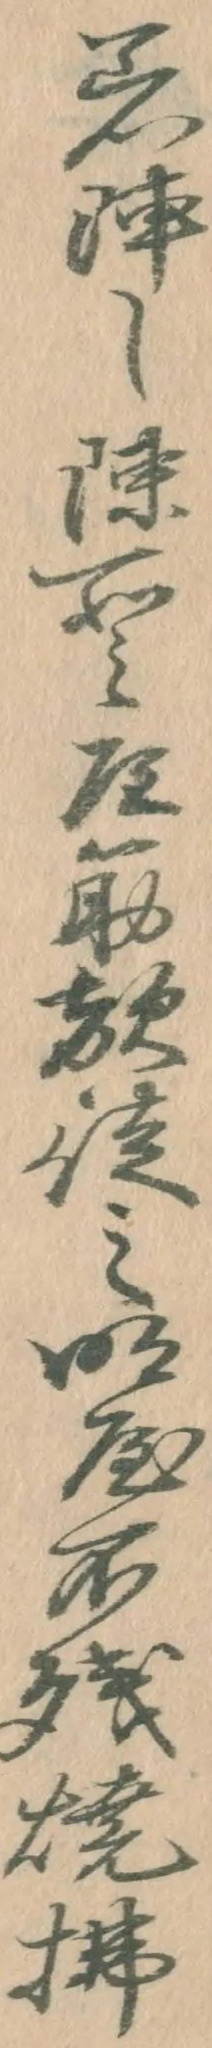着陣し陳所之道筋敵徒之明屋不残焼払

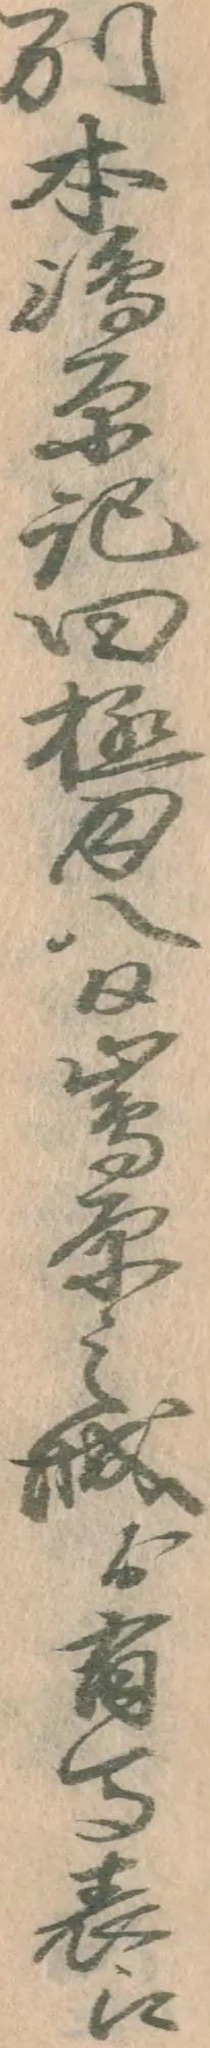別本島原記曰極月八日島原之城ゟ有馬表江
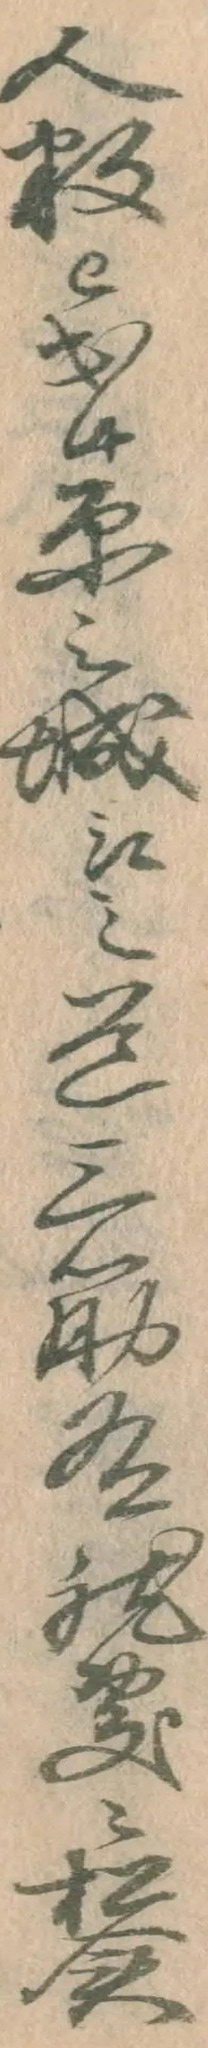人数被遣候原之城江之道三筋有然處に松倉
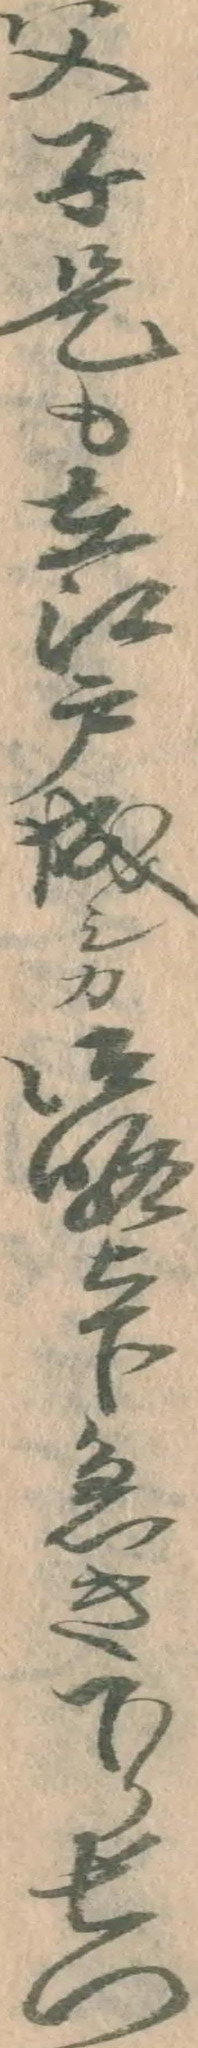父子是も在江戸成しか御暇被下急き下り長門
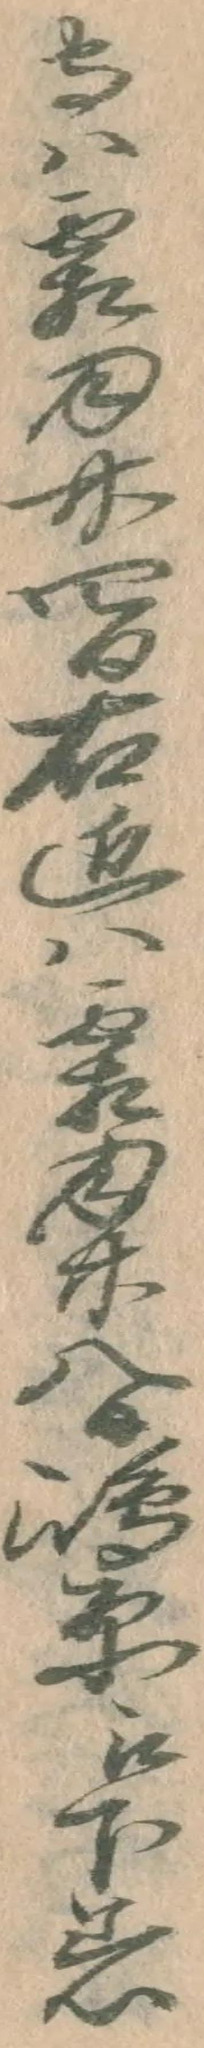守は霜月廿四日右近は霜月廿八日島原江下着
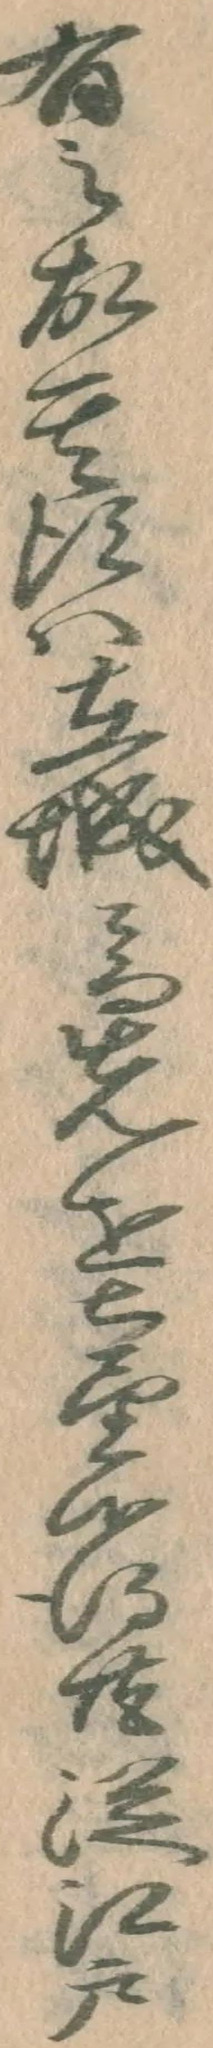有之故其段は在城に而先を被届候得共従江戸
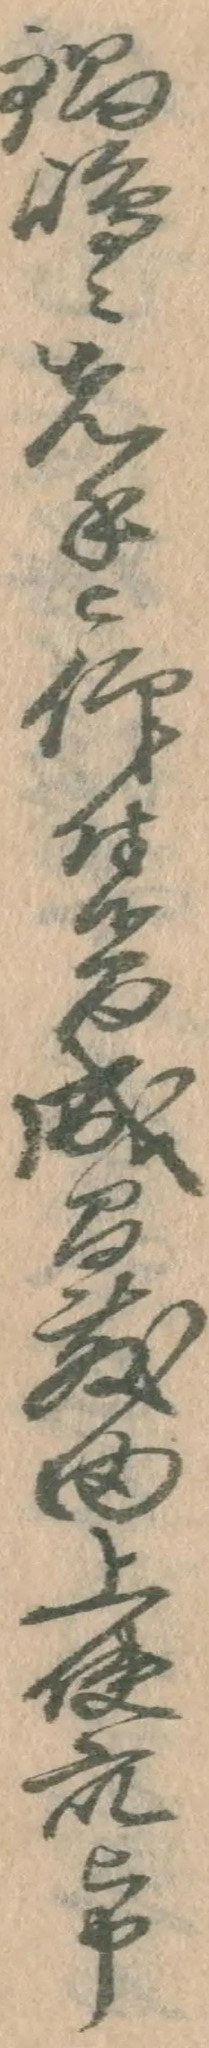鍋島に先手被仰付候間成間敷由上使衆被申
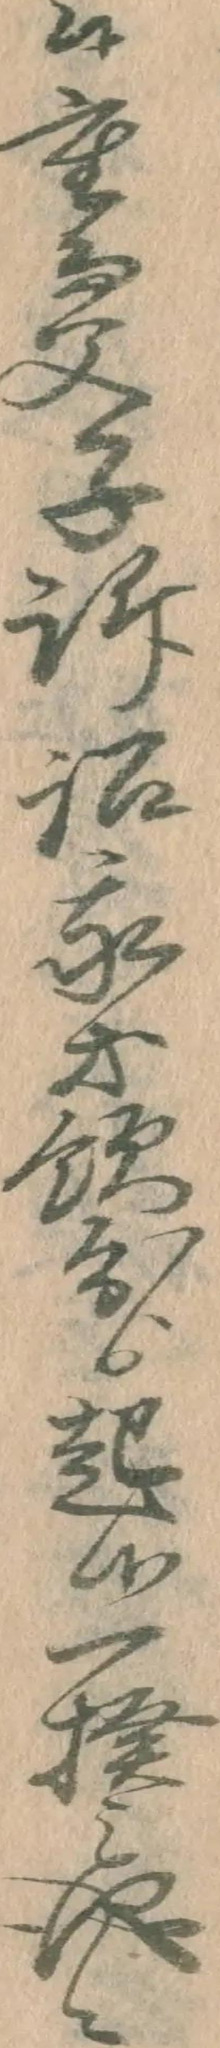候重而父子訴訟我等領分ゟ起候一揆之儀に
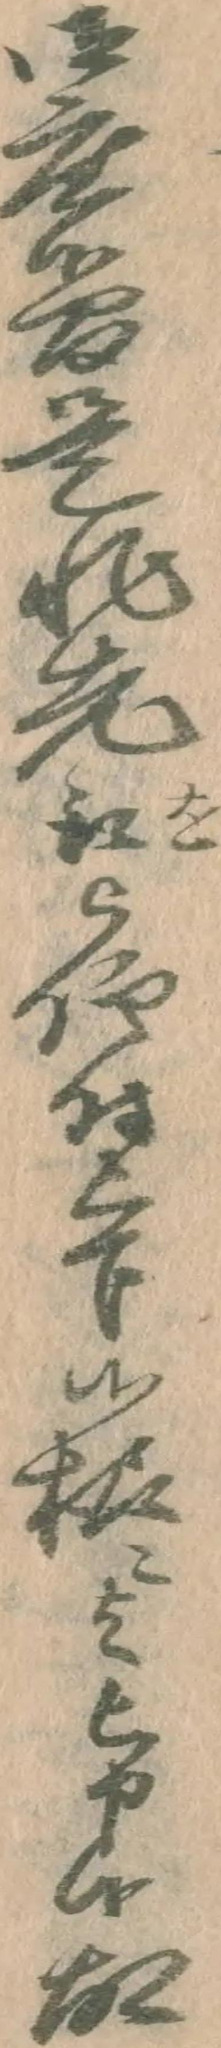御座候間是非先を被仰付被下候様に与被申候故
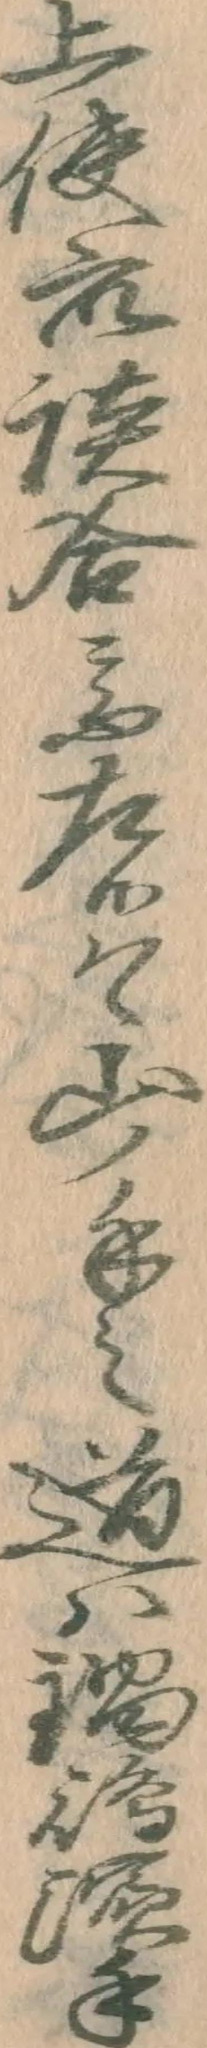上使衆談合に而左候はゝ山之手之道は鍋島浜手
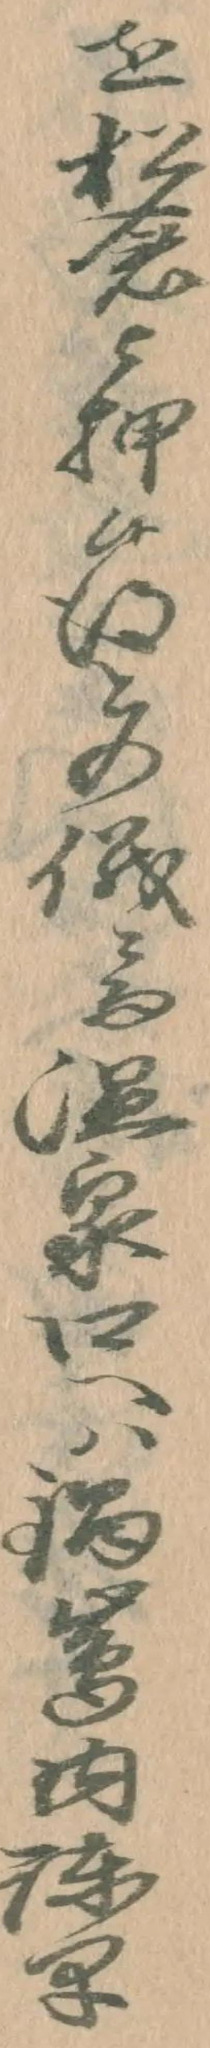を松倉被押候得との儀に而温泉口へは鍋島内諌早
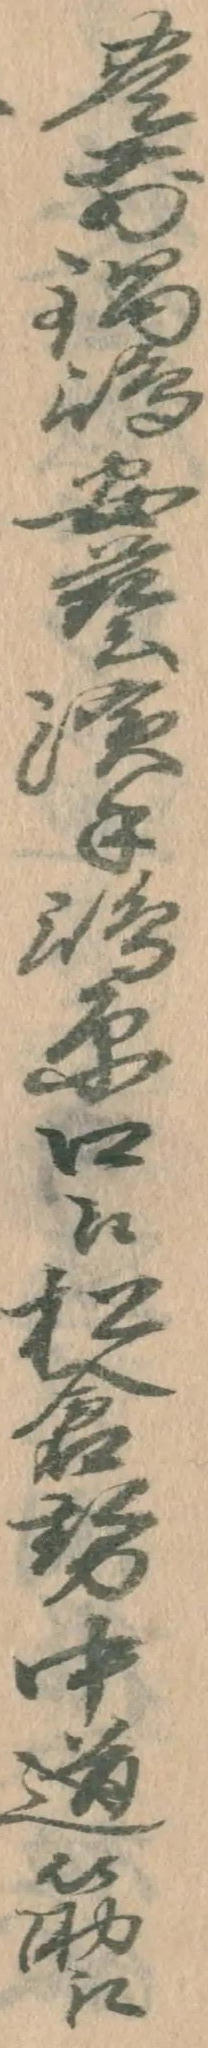豊前鍋島安芸浜手島原口江松倉勢中道筋江
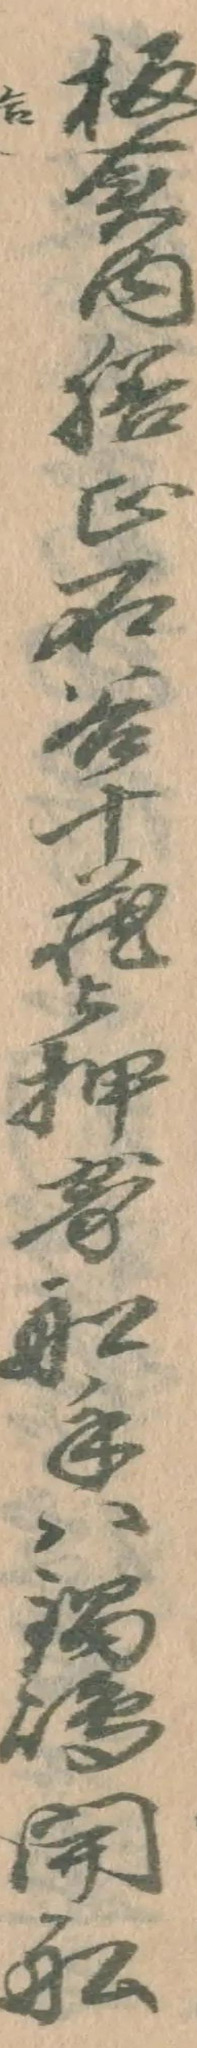板倉内膳正石谷十蔵被押寄舩手は鍋島開舩
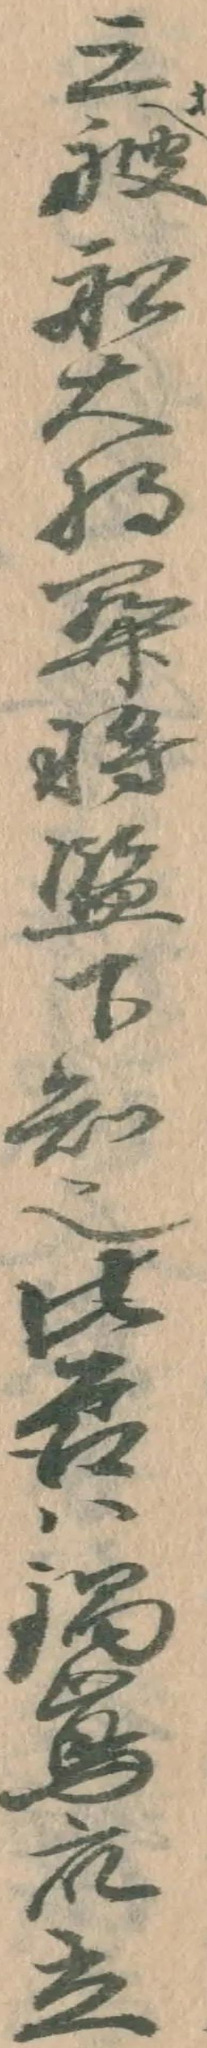三拾艘舩大将関将監下知也此節は鍋島衆立
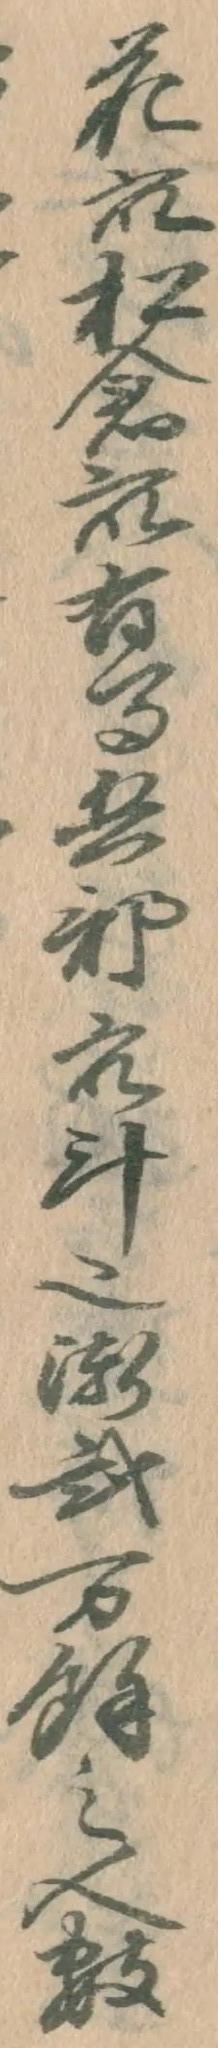花衆松倉衆有馬兵部衆斗也漸弐万余人人数
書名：切支丹御退治記 49巻. [4]
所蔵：国立国会図書館 National Diet Library, JAPAN
